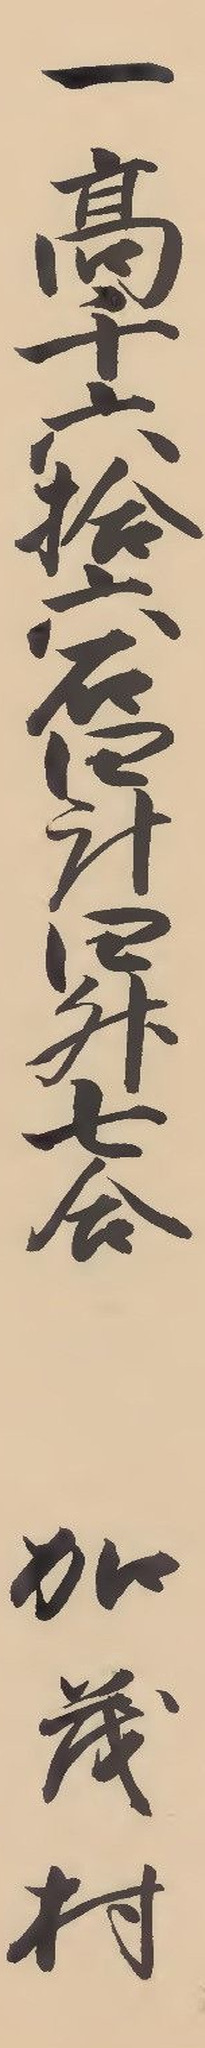一高千六拾六石四斗四升七合加茂村
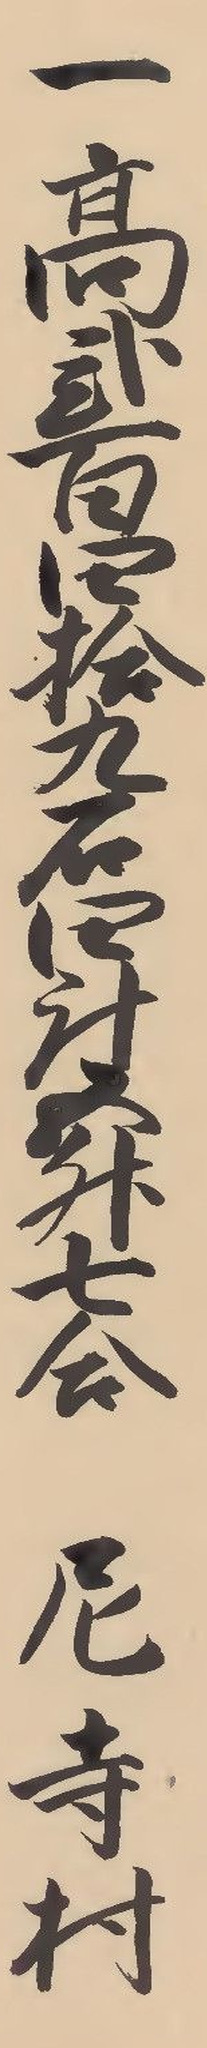一高弐百四拾九石四斗五升七合尼寺村
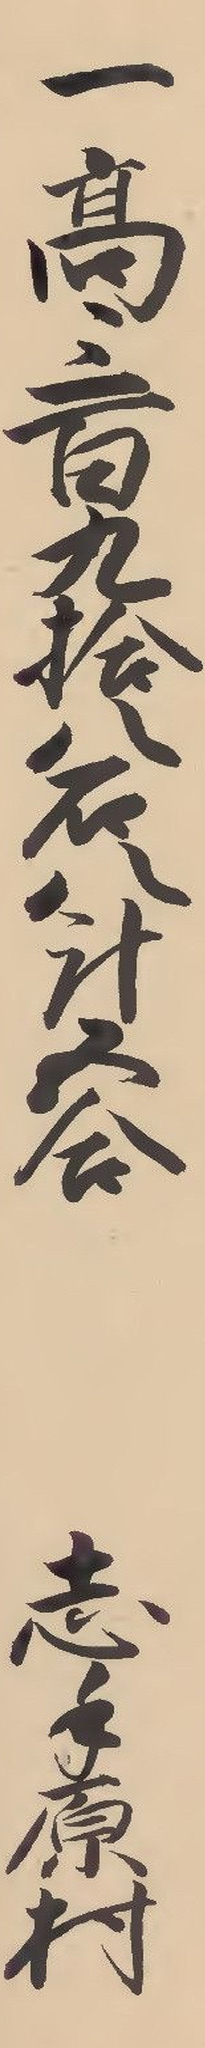一高三百九拾八石八斗五合志手原村
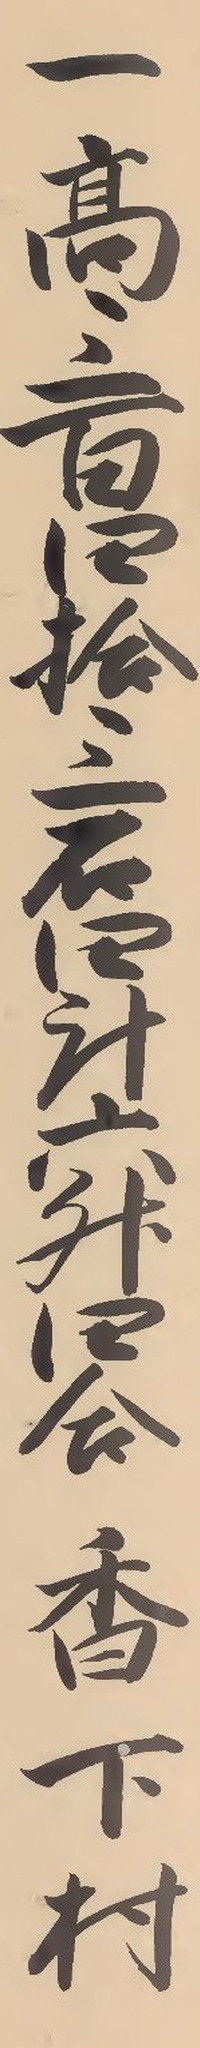一高三百四拾三石四斗六升四合香下村
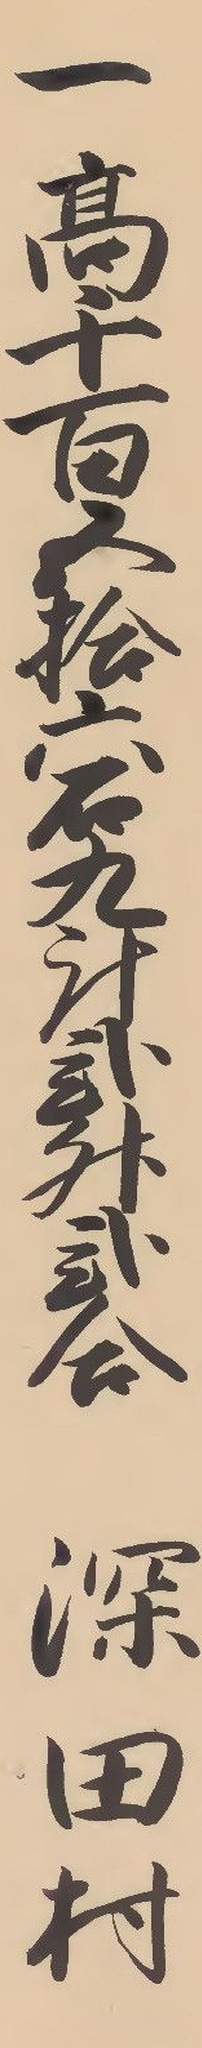一高千百五拾六石九斗弐升弐合深田村
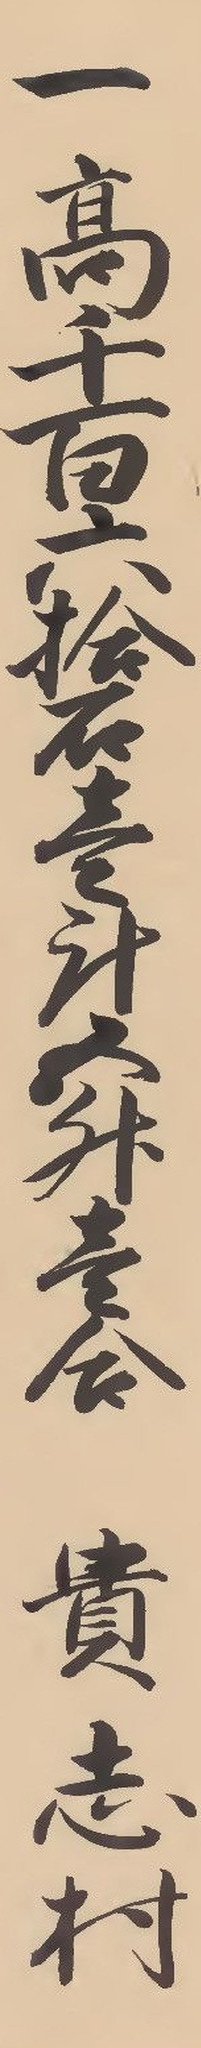一高千百六拾石壱斗五升壱合貴志村
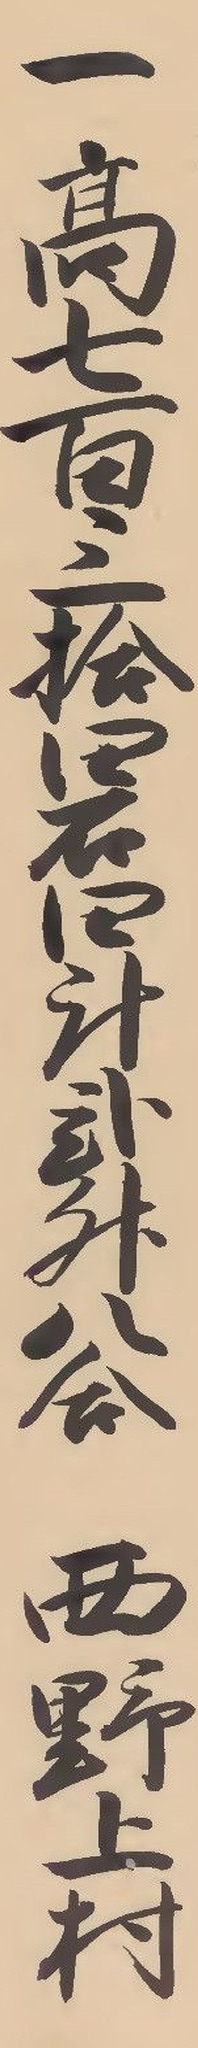一高七百三拾四石四斗弐升八合西野上村

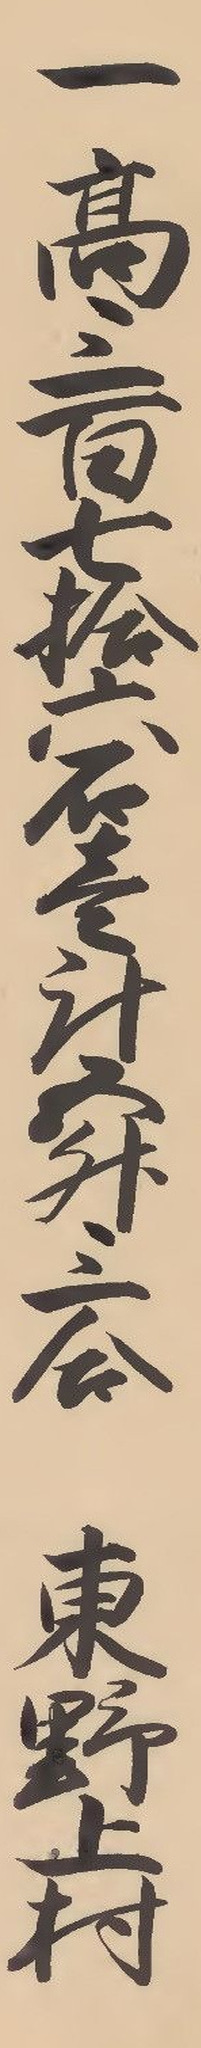一高三百七拾六石壱斗五升三合東野上村
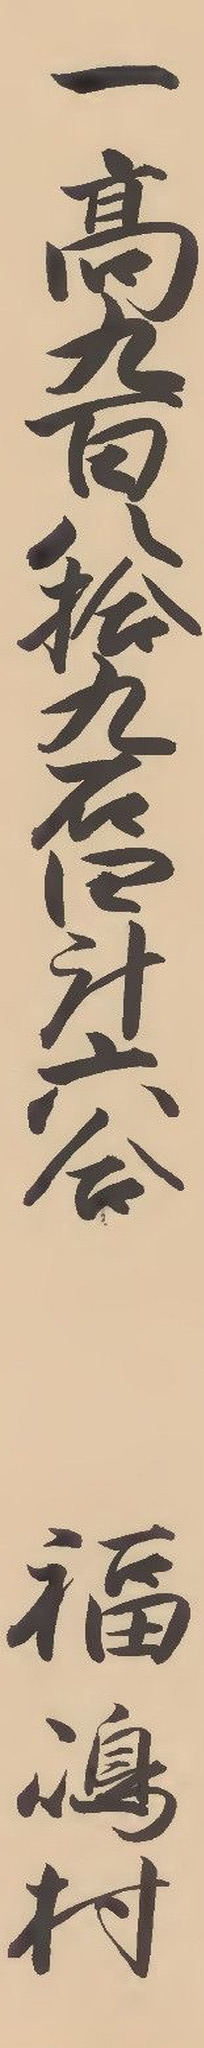一高九百八拾九石四斗六合福島村
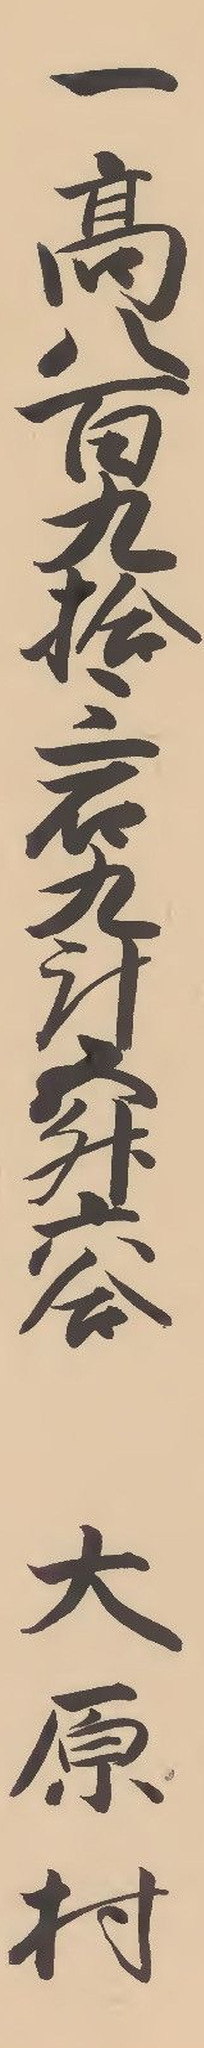一高八百九拾三石九斗五升六合大原村
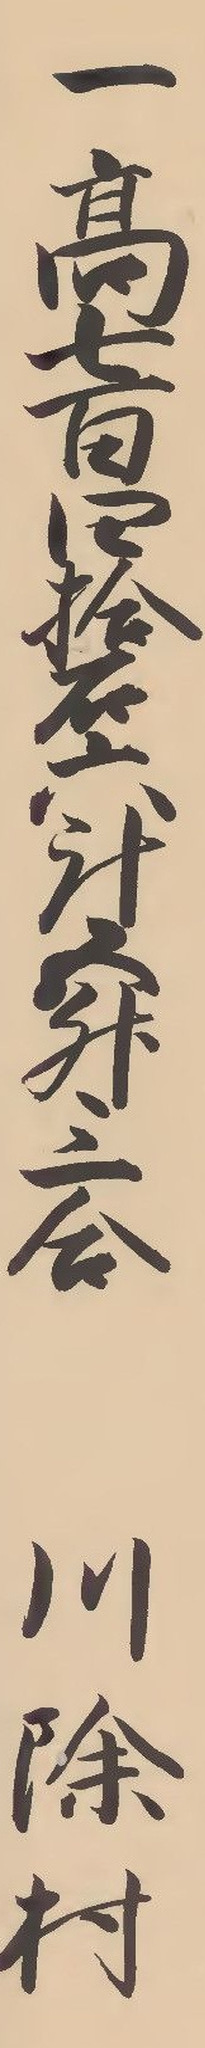一高七百四拾石六斗五升三合川除村
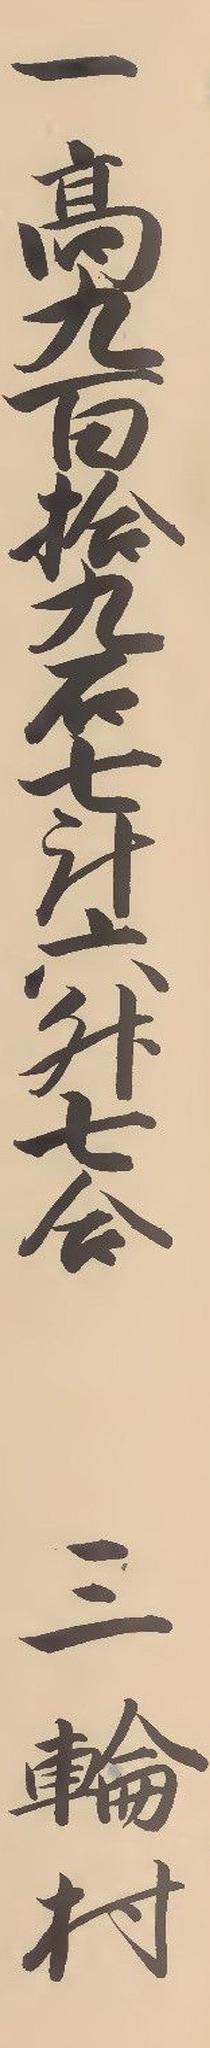一高九百拾九石七斗六升七合三輪村
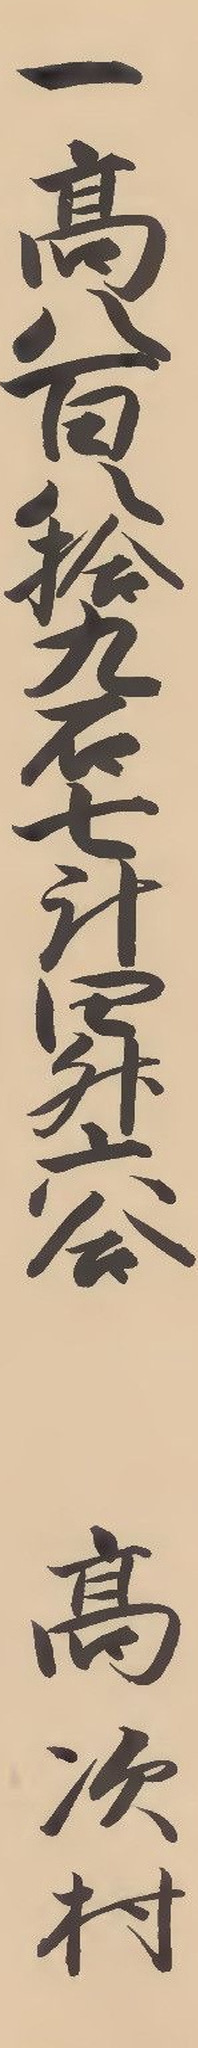一高八百八拾九石七斗四升六合高次村
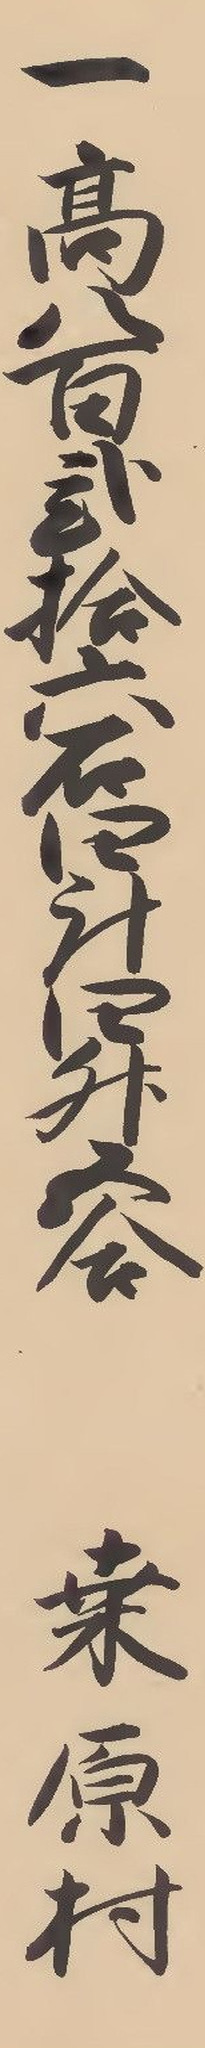一高八百弐拾六石四斗四升五合桑原村
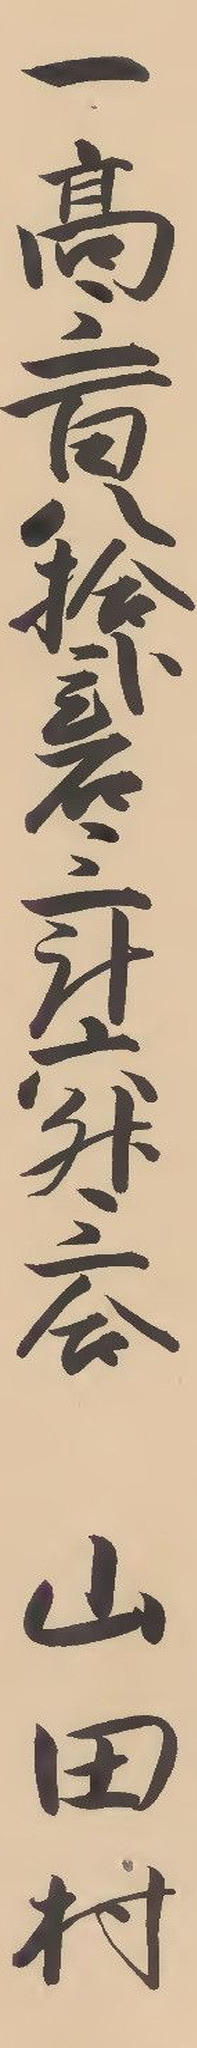一高三百八拾弐石三斗六升三合山田村

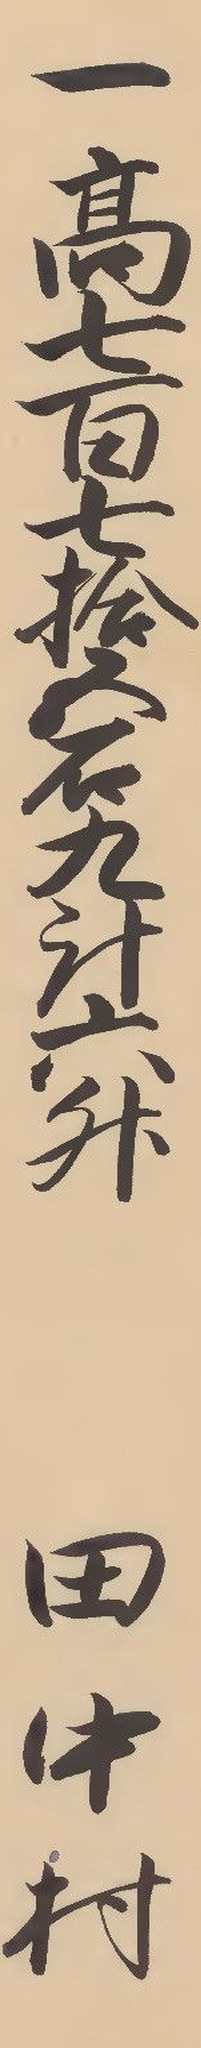一高七百七拾五石九斗六升田中村
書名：摂津国郷帳
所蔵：国立公文書館 National Archives of Japan
